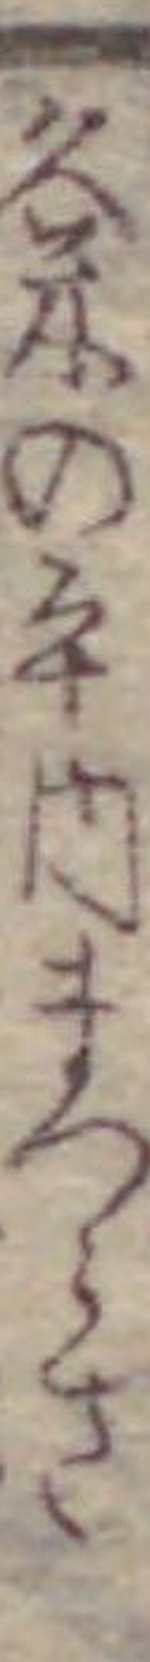久米の平門まつらさ
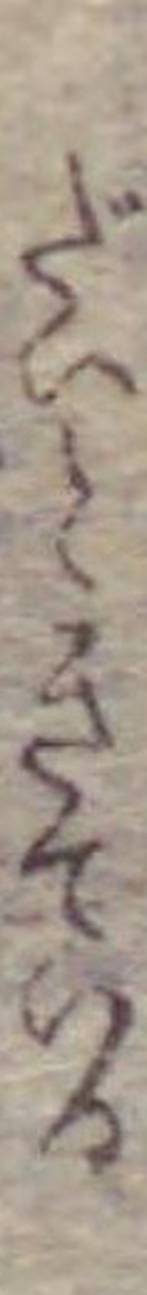だいときている
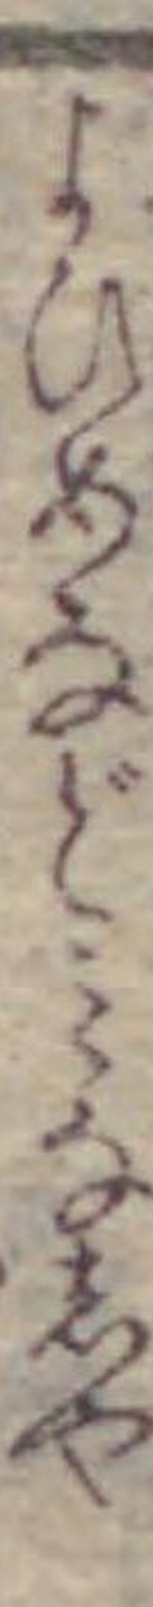よひめなどみなしや
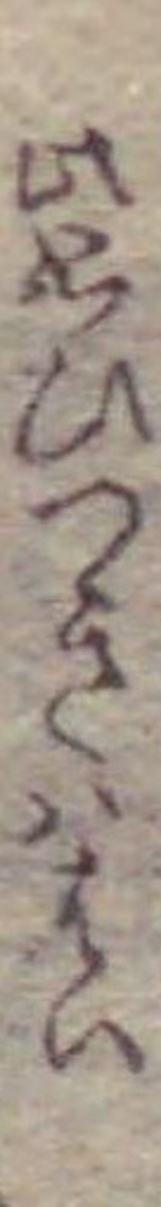此思ひつきははい
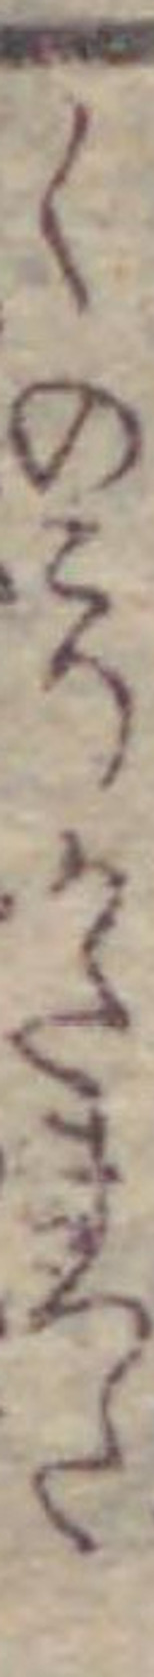くのこりかたまつた
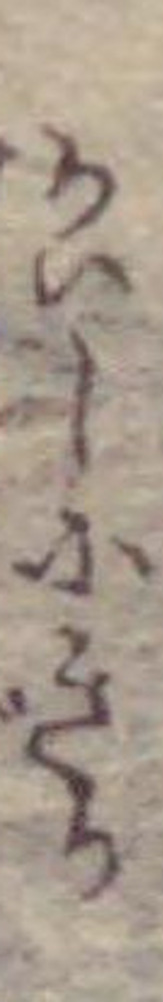かいしにきか
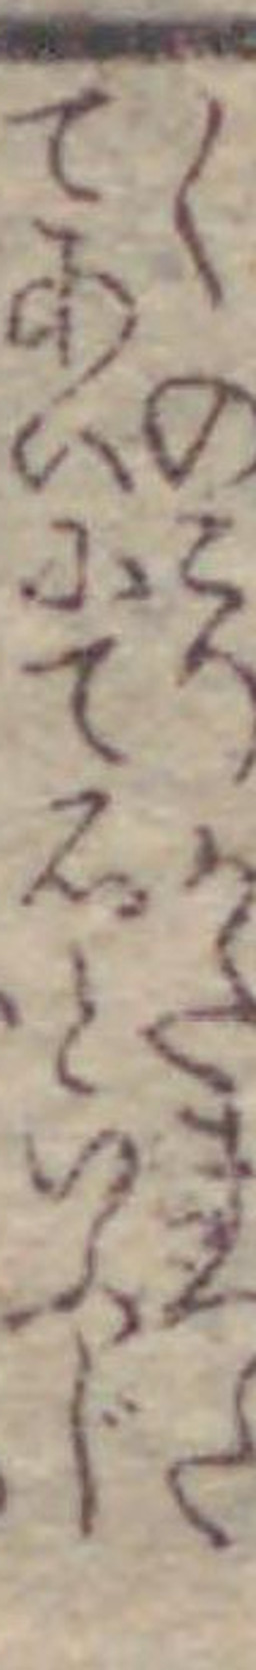てあいにて石といふじ
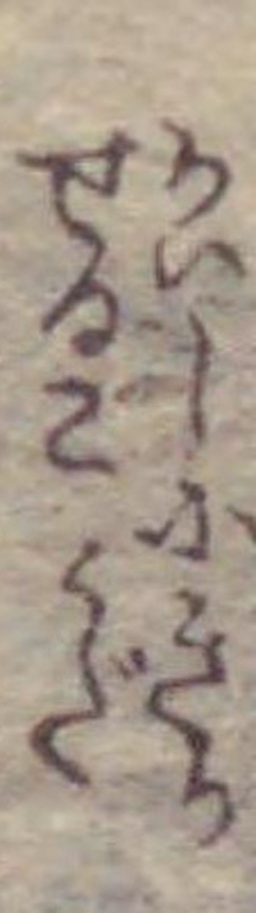せることだ
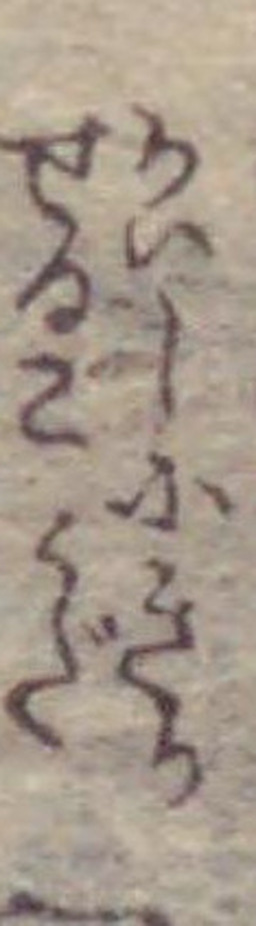せることだ
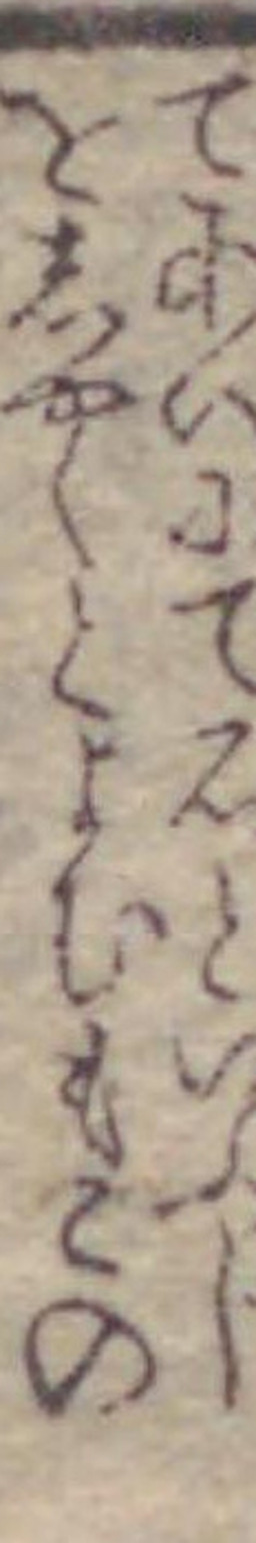をしやくとよむもこの
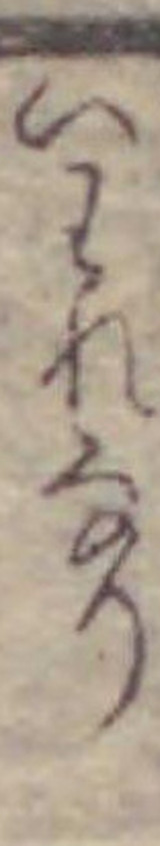いはれなり
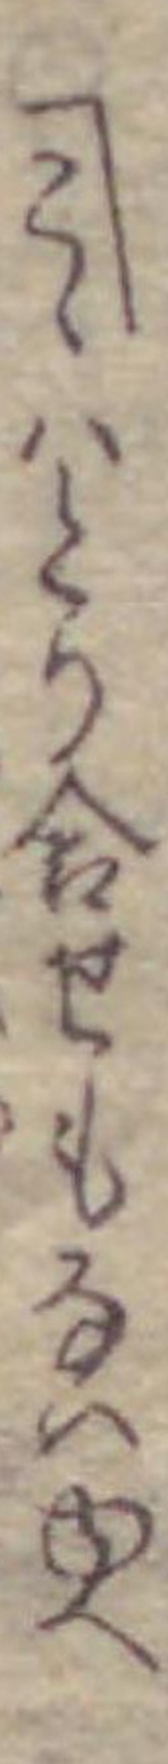〽ここはとり合せもないゆへ
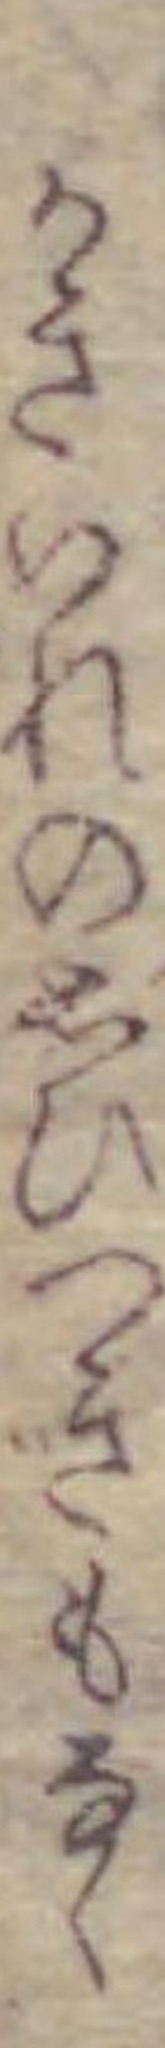かきいれの思ひつきもなく
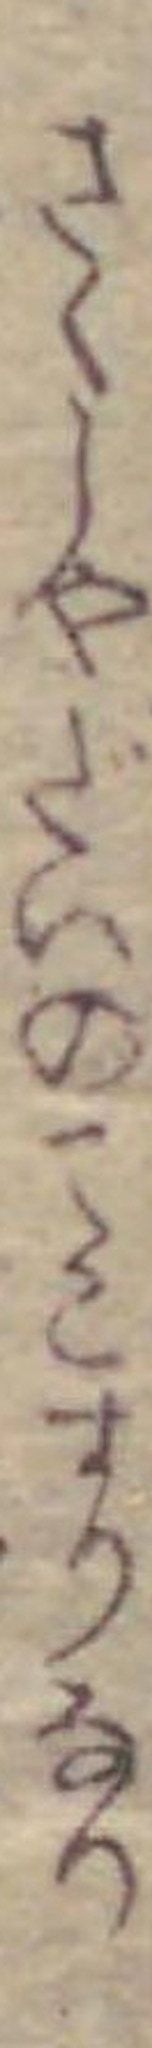さくしやだいのてこずりなり
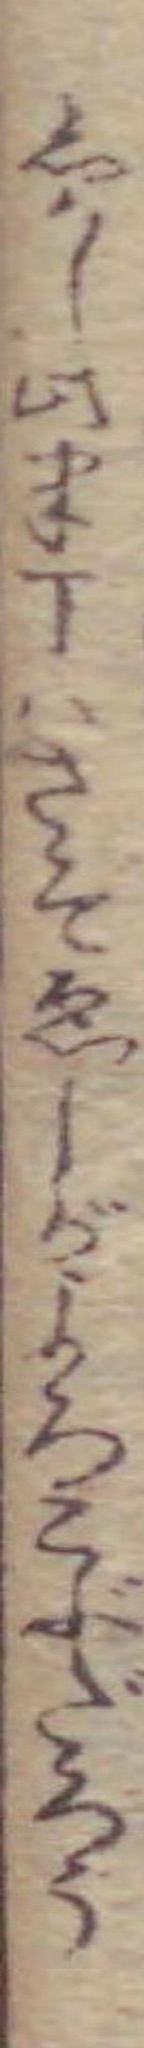しかし此半丁はさそゑしがよろこぶだろう

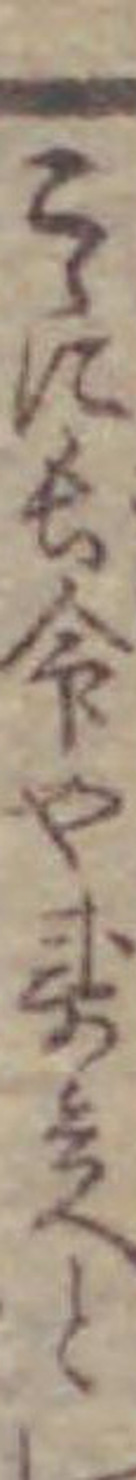こゝに長命や寿兵へと
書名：鼻下長生薬 : 3巻
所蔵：国立国会図書館 National Diet Library, JAPAN
